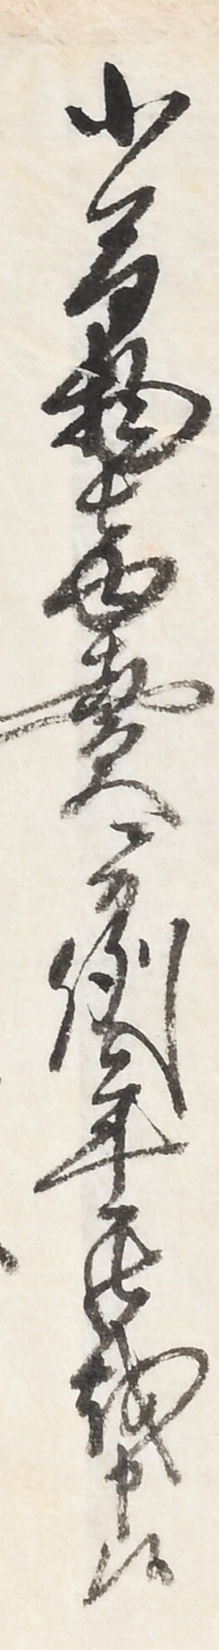小間物商売ニ而例年罷越申候
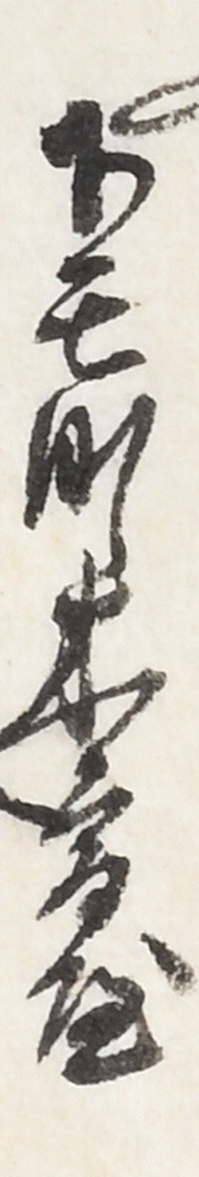下モ町木曽屋
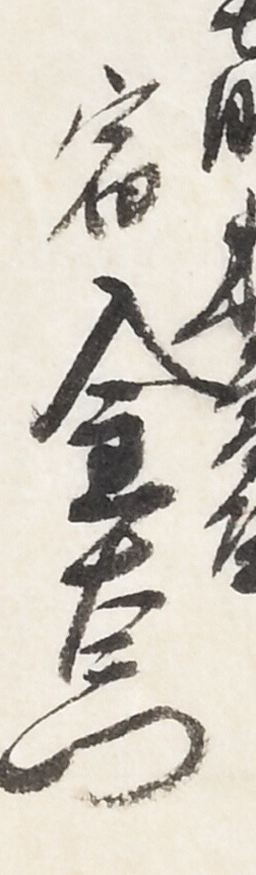宿金右衛門
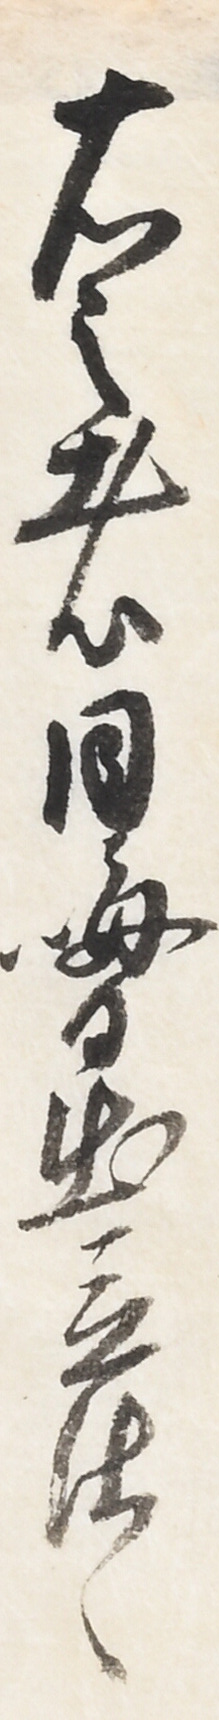右之者同晦日出立仕候
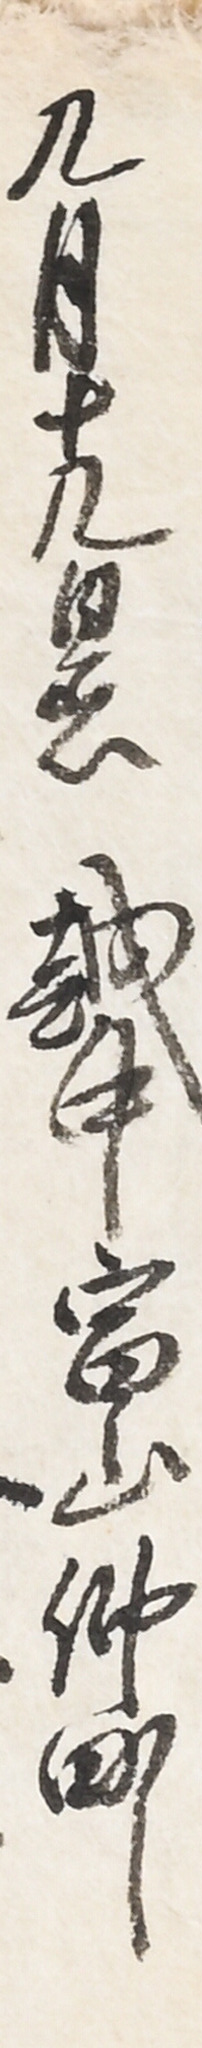八月十九日着越中富山中町
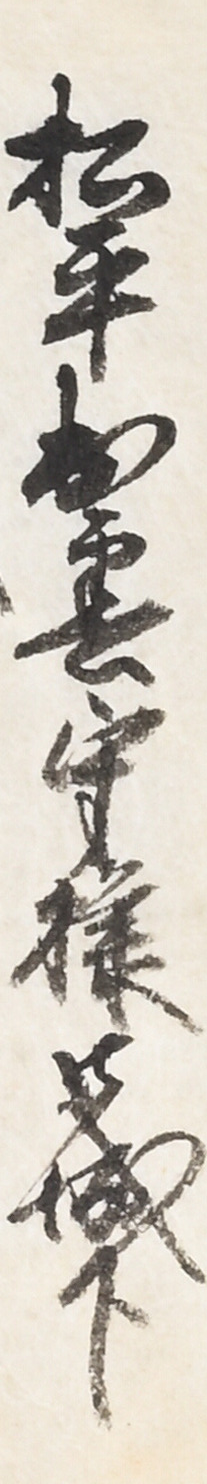松平出雲守様御城下
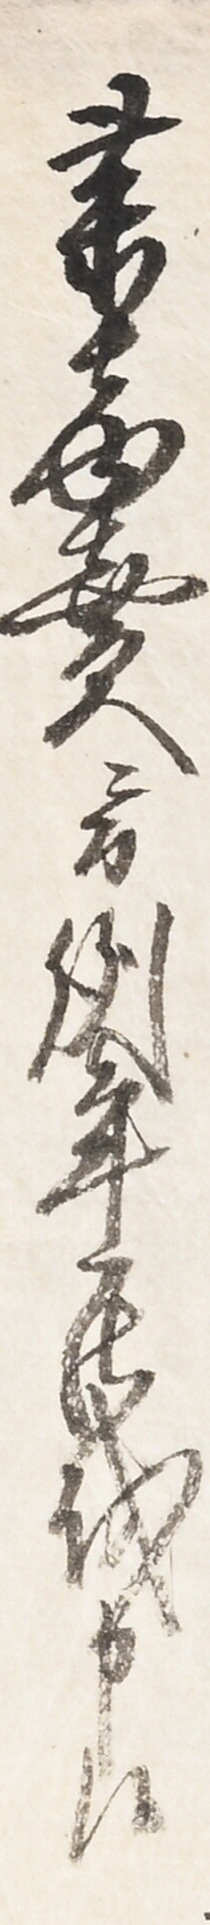書商売ニ而例年罷越申候
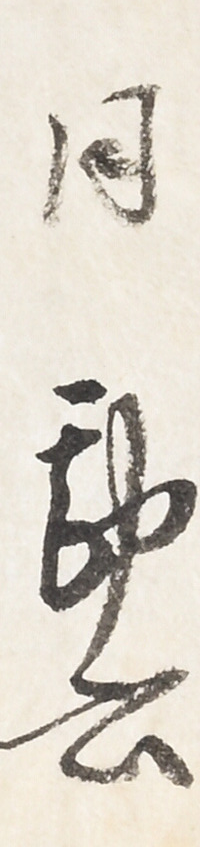同勘六
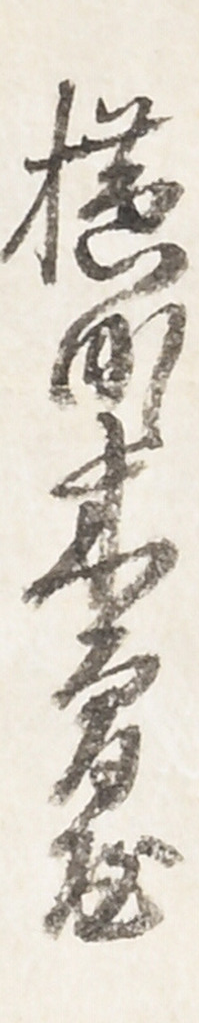横町木曽屋
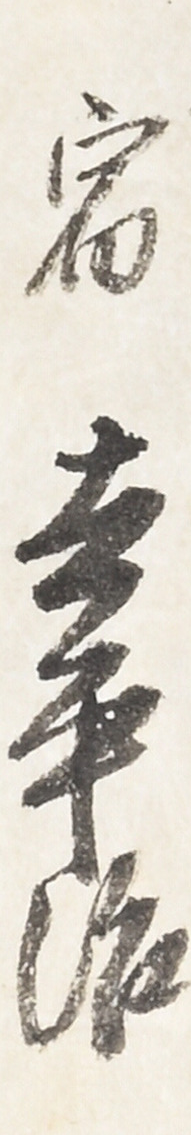宿太平治
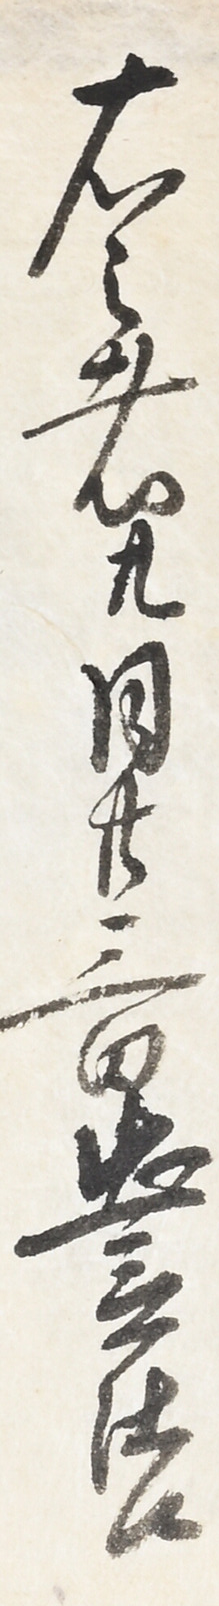右之者共同廿三日出立仕候
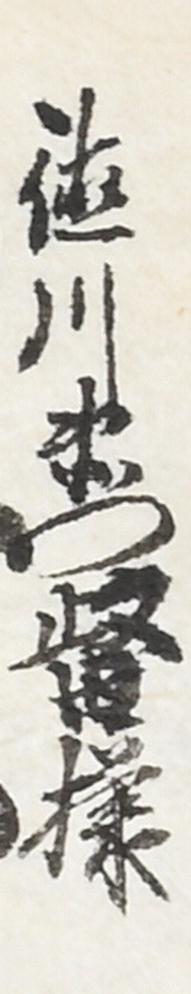徳川衛門督様
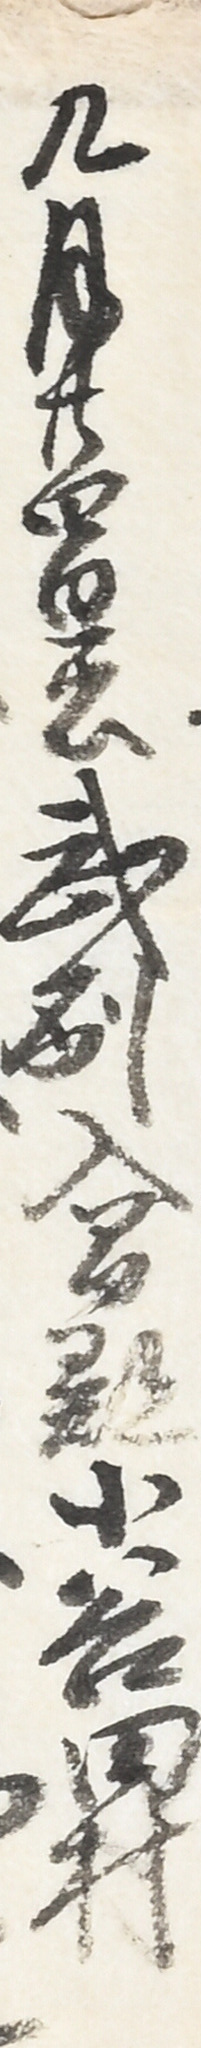八月廿四日着武州入間郡小谷田村
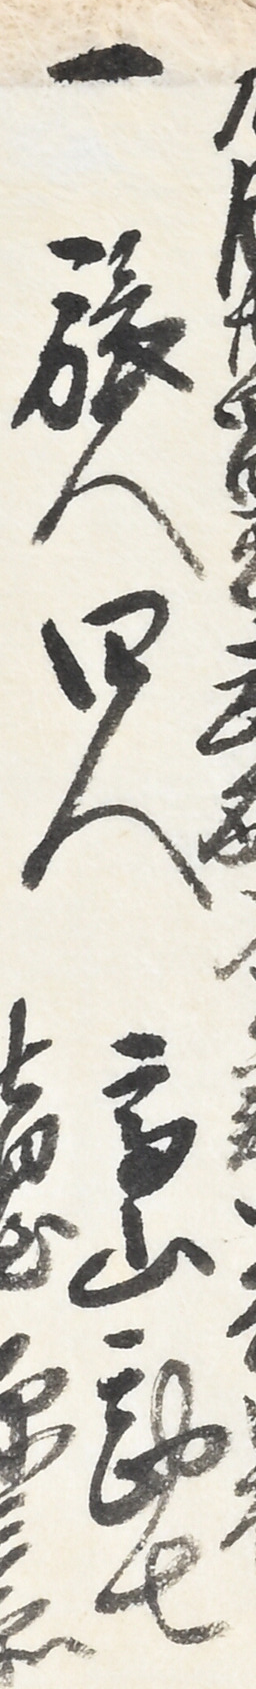一旅人四人高山勘七
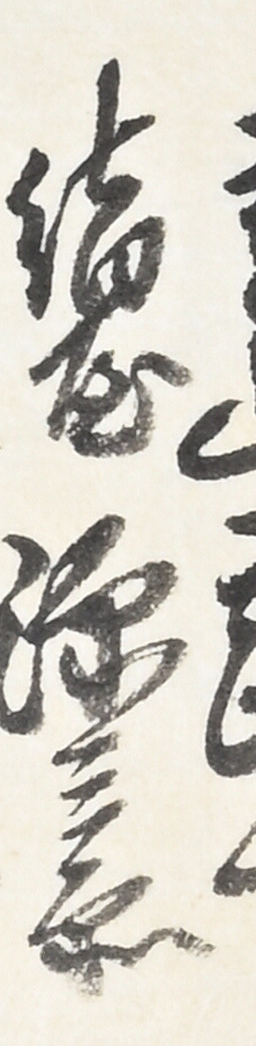緒屋源兵衛
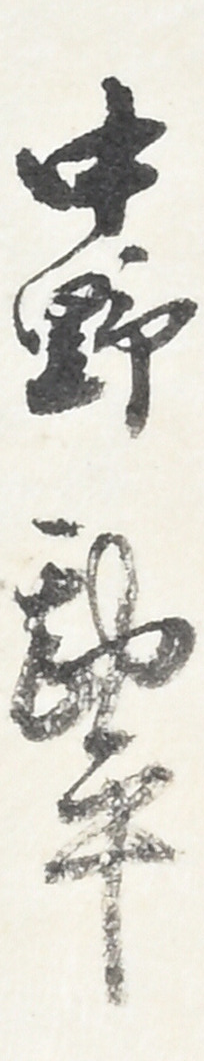中野勘平
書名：旅人泊控帳
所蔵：伊那市立高遠町図書館・合同会社AMANE
